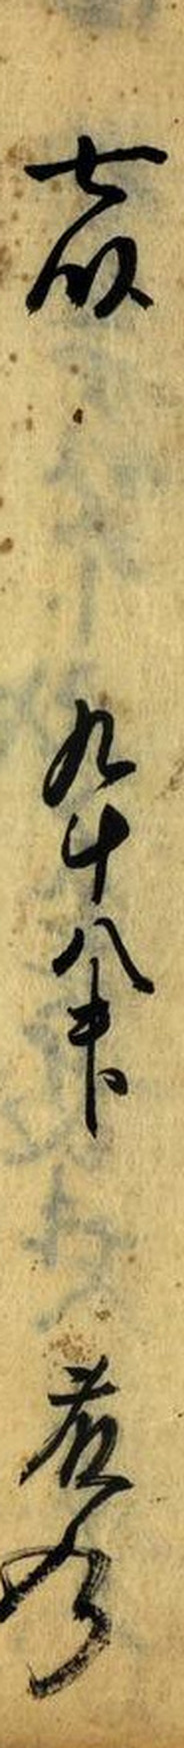同七畝九斗八升藤九郎
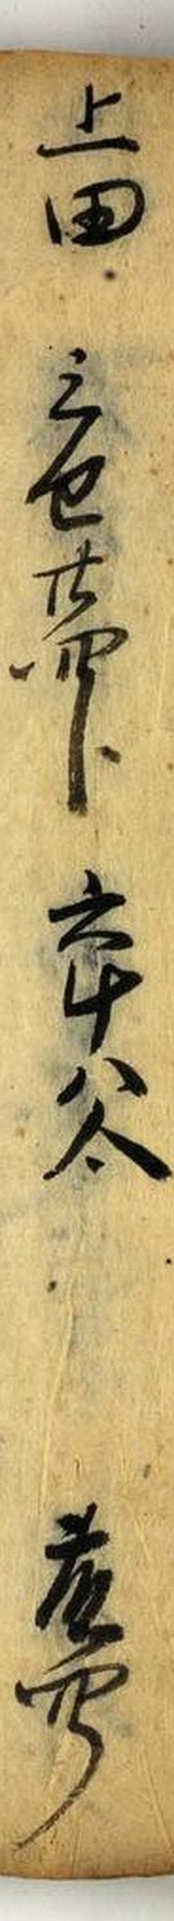上田三セ廿四分六斗八合藤四郎
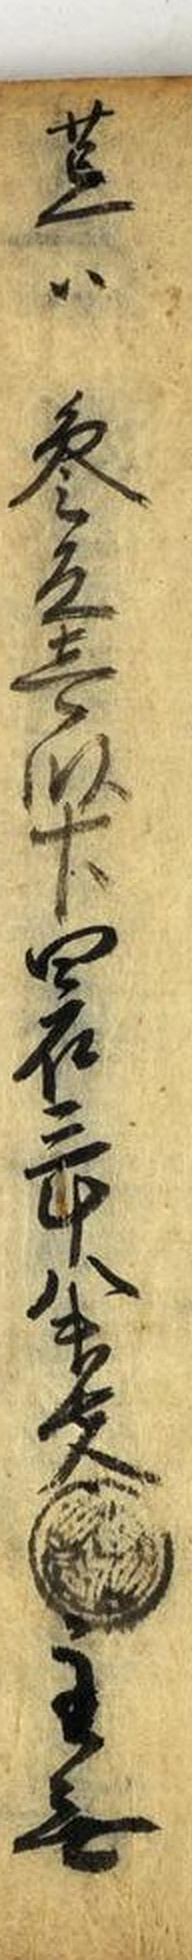荒同参反壱畝一分四石三斗八升七合㊞主無
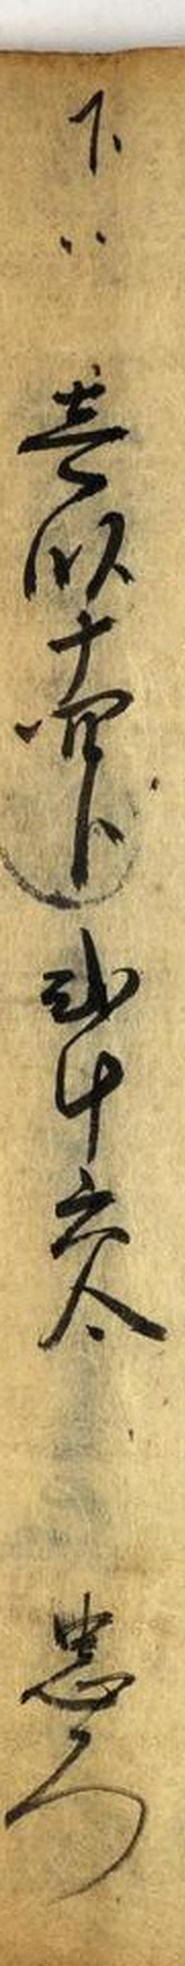下同壱畝十四分弐斗六合忠右衛門
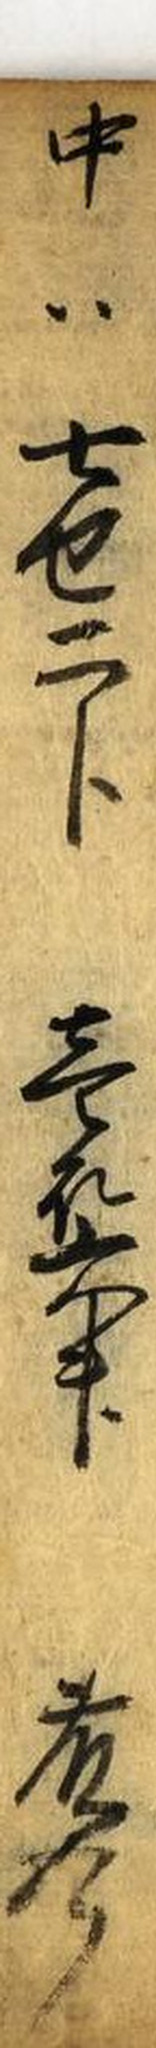中同七セ二分壱石六升藤九郎
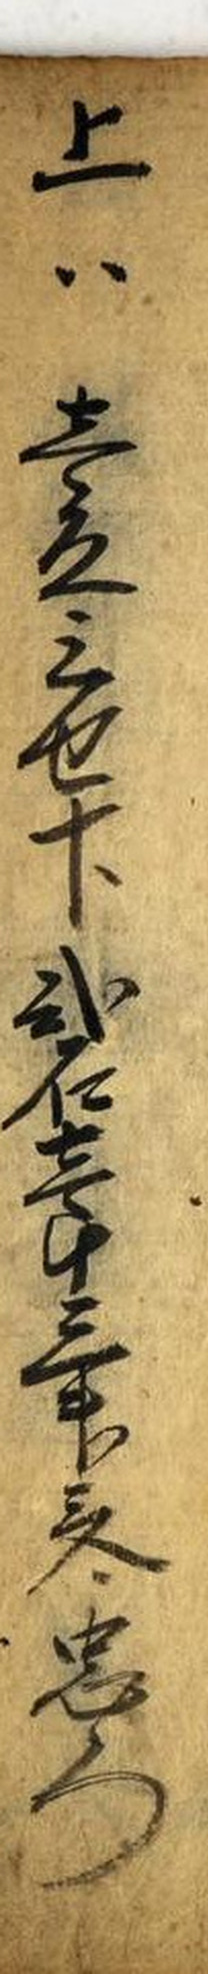上同壱反三セ十分弐石壱斗三升三合中右衛門
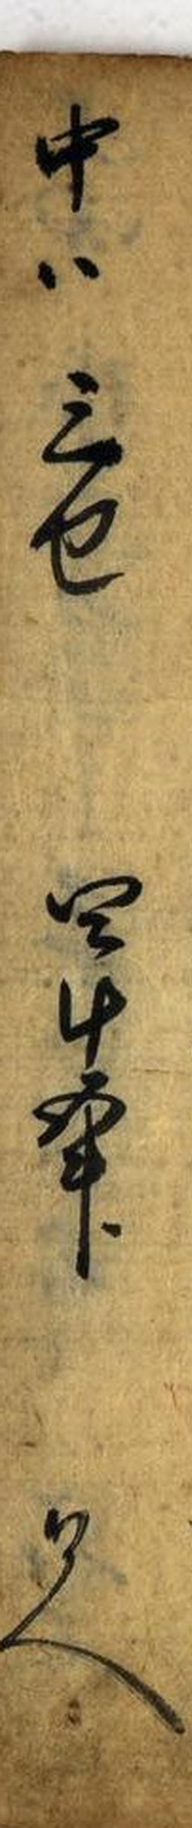中同三セ四斗五升同人

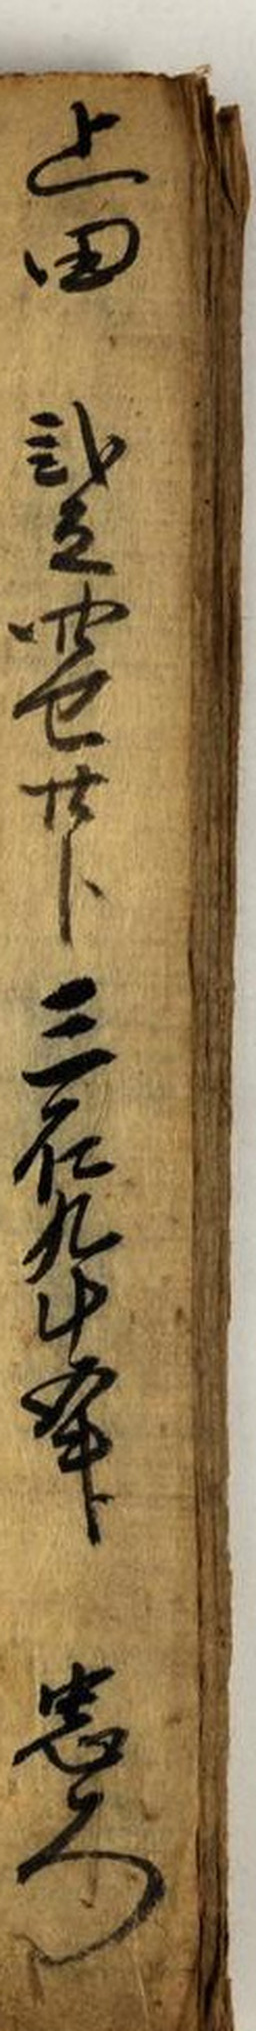上田弐反四セ廿分三石九斗五升忠右衛門
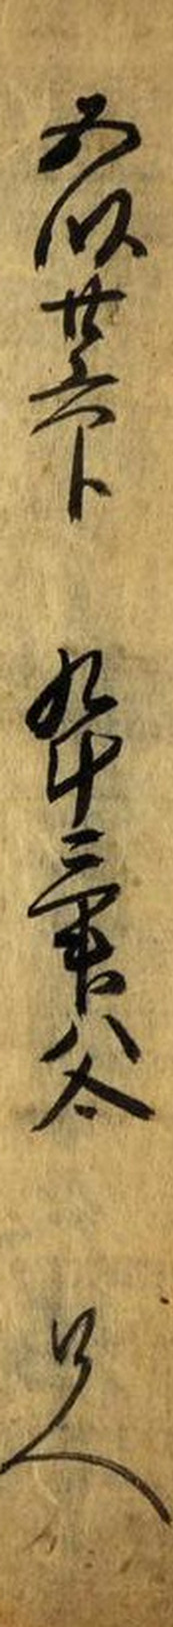同五畝廿六分九斗三升八合同人
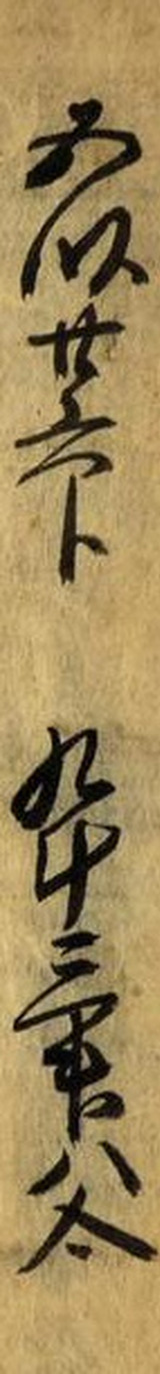同五畝廿六分九斗三升八合同人
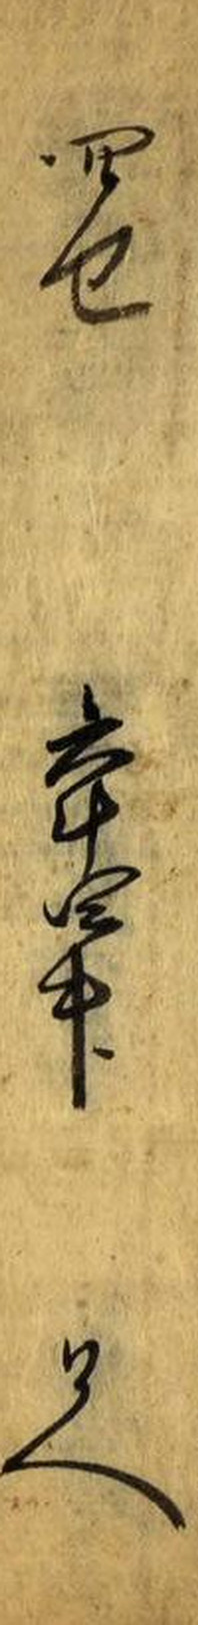同四セ六斗四升同人
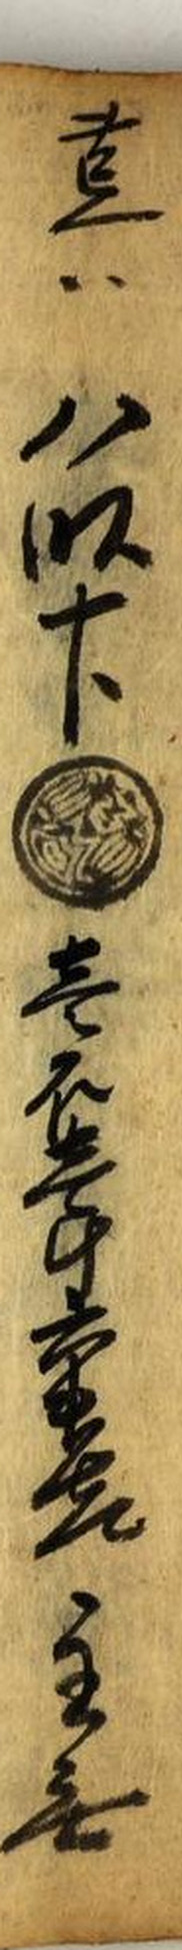荒同八畝一分㊞壱石壱斗六升七合主無
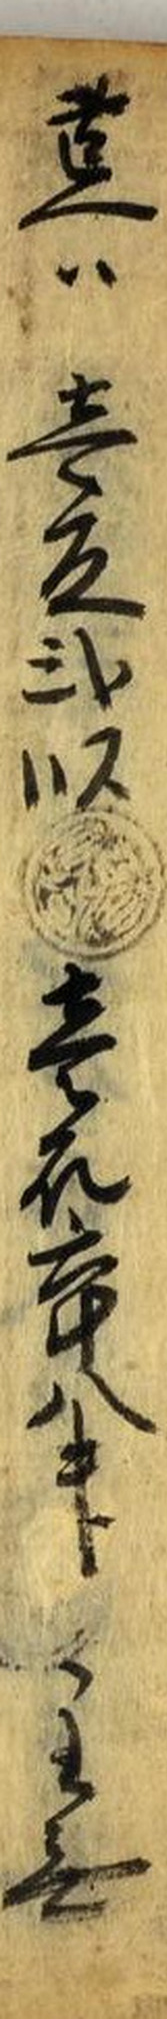荒同壱反弐畝㊞壱石六斗八升主無
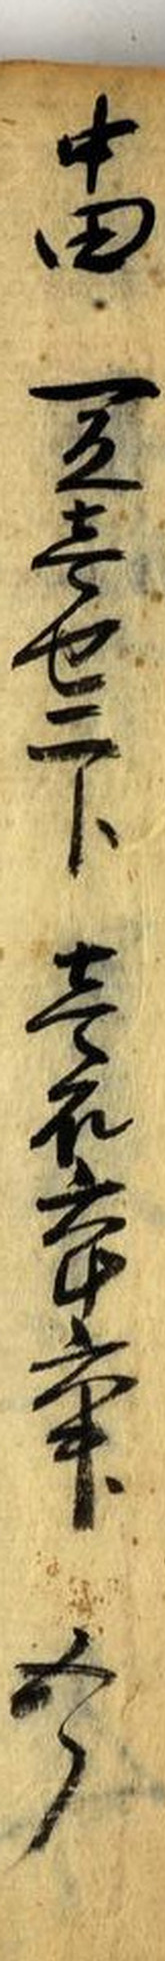中田一反壱セ二分壱石六斗六升五郎
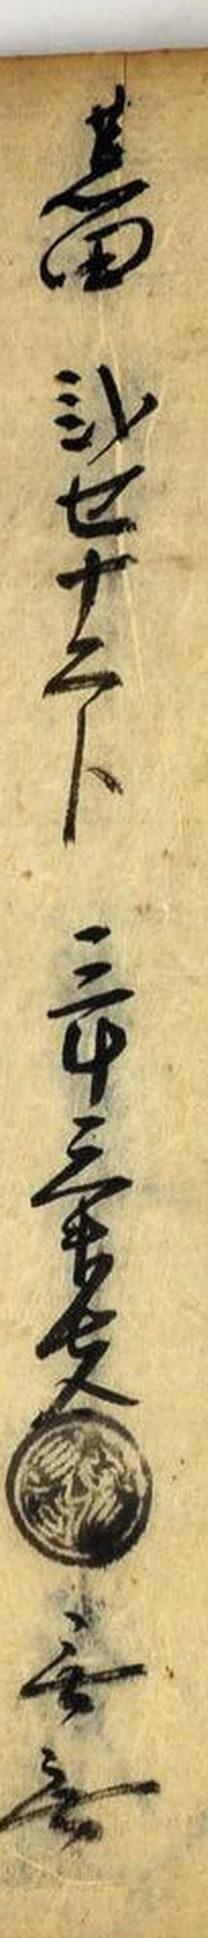荒田弐セ十二分三斗三升七合㊞無無
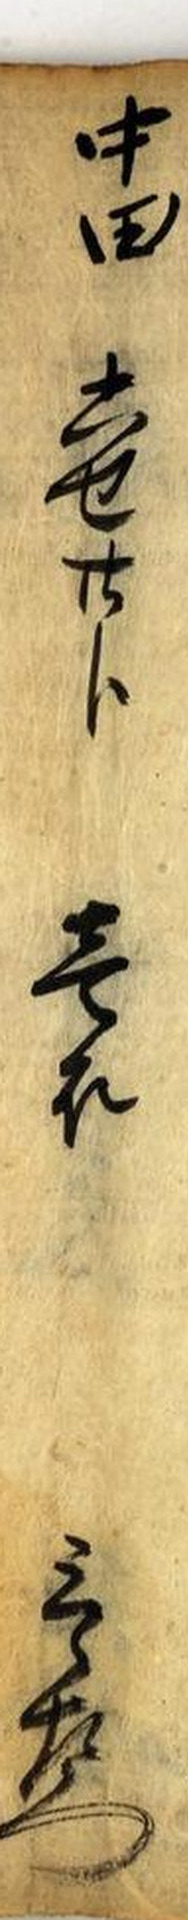中田六セ廿分壱石三郎左衛門
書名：越前国西方内志津庄内本折村御検地帳
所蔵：福井県文書館 Fukui Prefectural Archives
